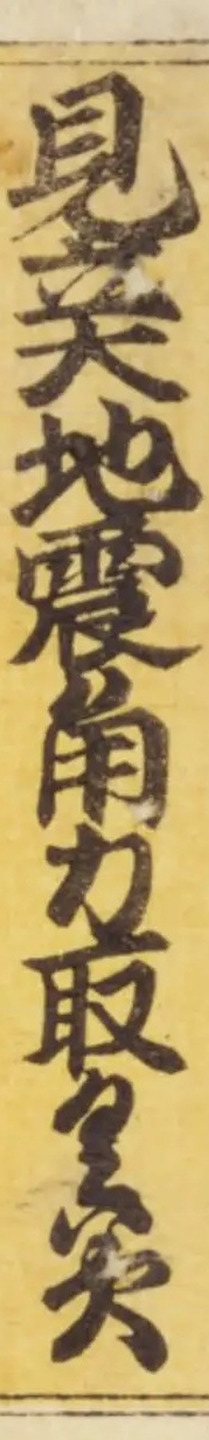見立大地震角力取くみ
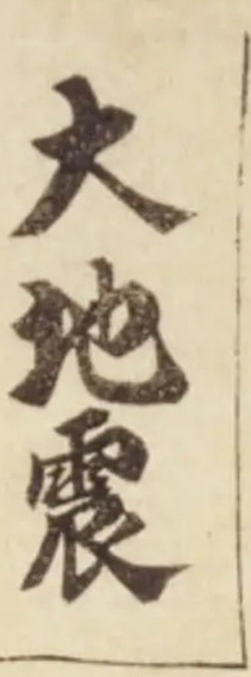大地震
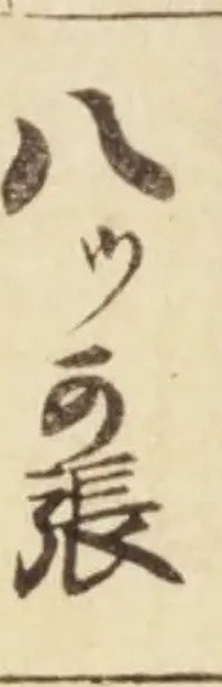八ッか張
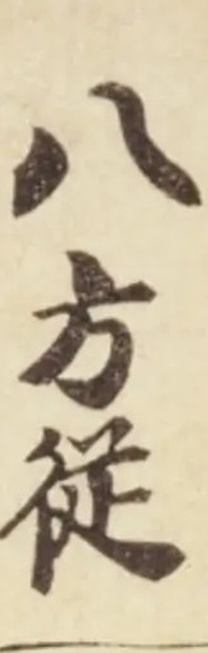八方従
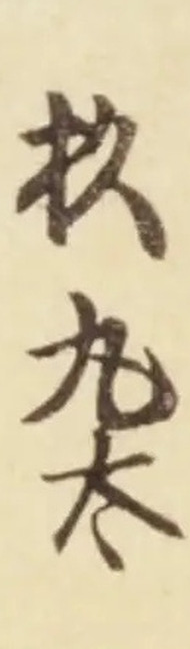杉丸太
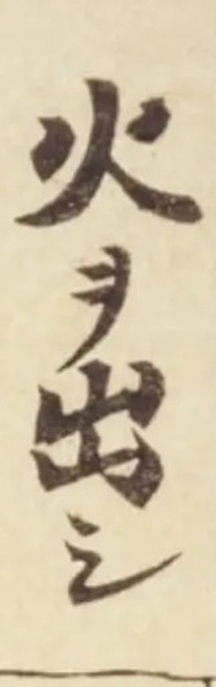火ヲ出シ
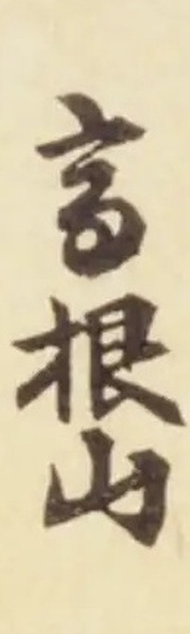高根山
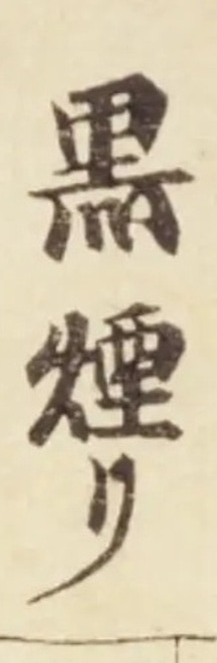黒煙り
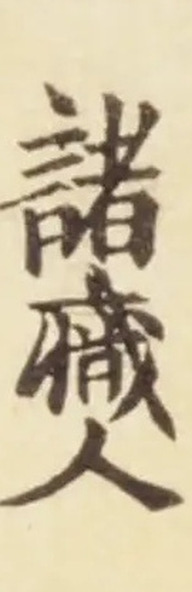諸職人
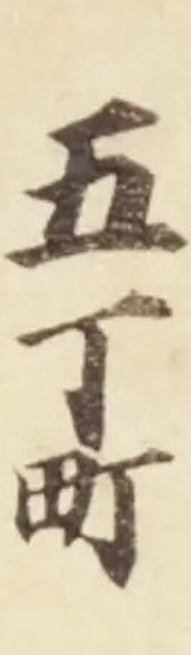五丁町
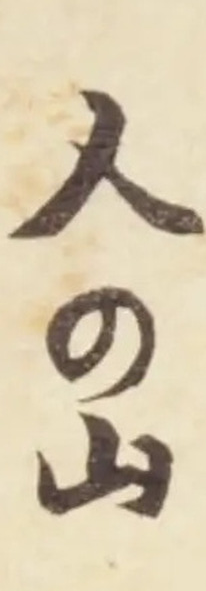人の山
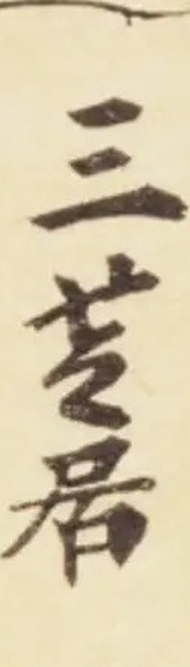三芝居
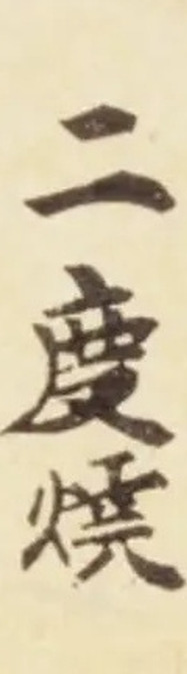二度焼
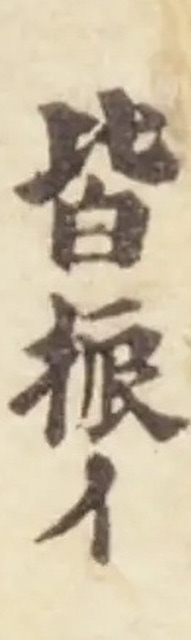皆振イ
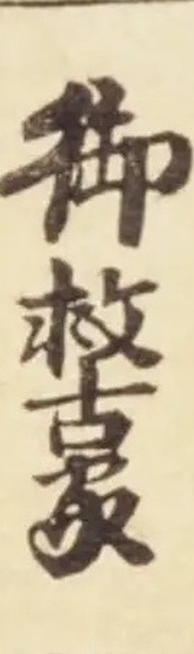御救古家
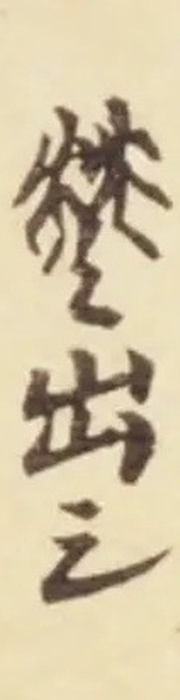焚出シ
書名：見たて大地震角力取くみ
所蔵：国立国会図書館 National Diet Library, JAPAN
